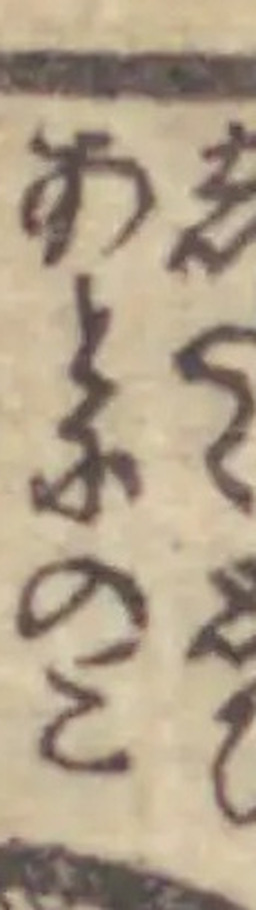あとにのこ
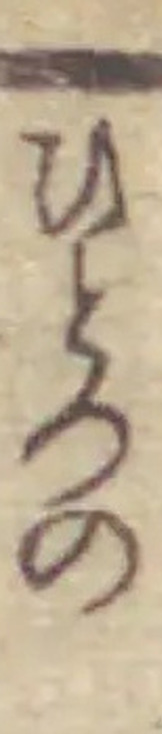ひとつの
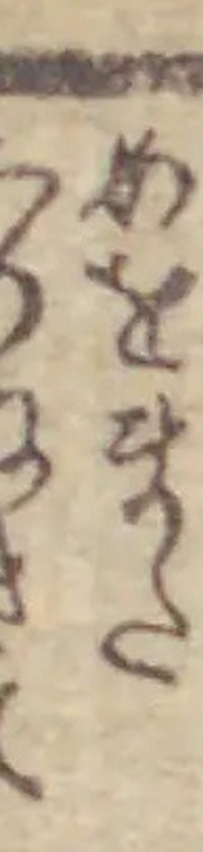くりぬきて
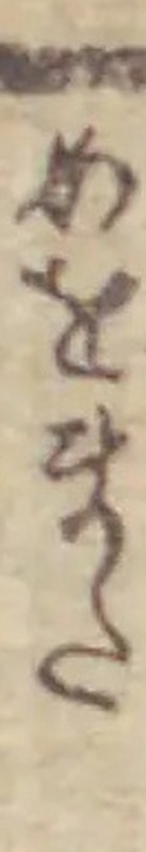めをまた
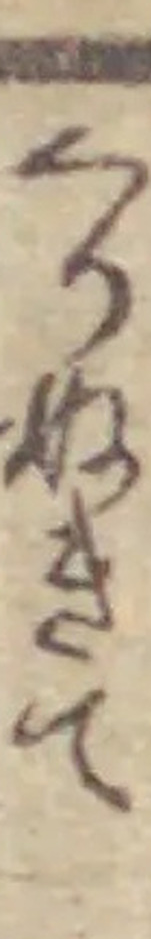くりぬきて
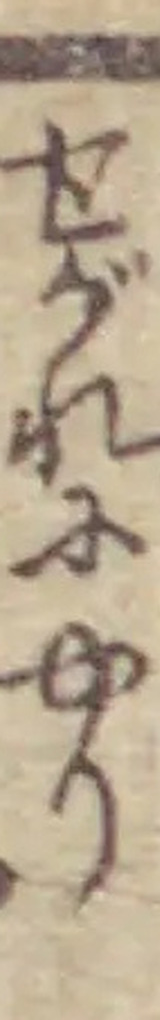せがれにやり
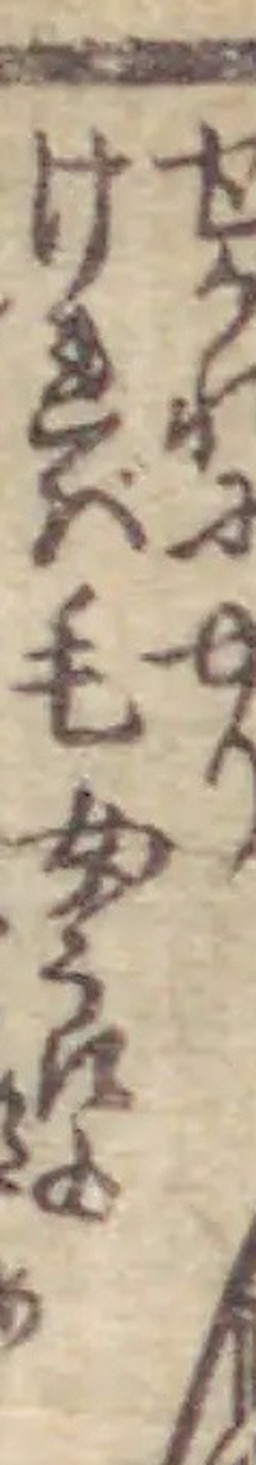ければ毛女郎の
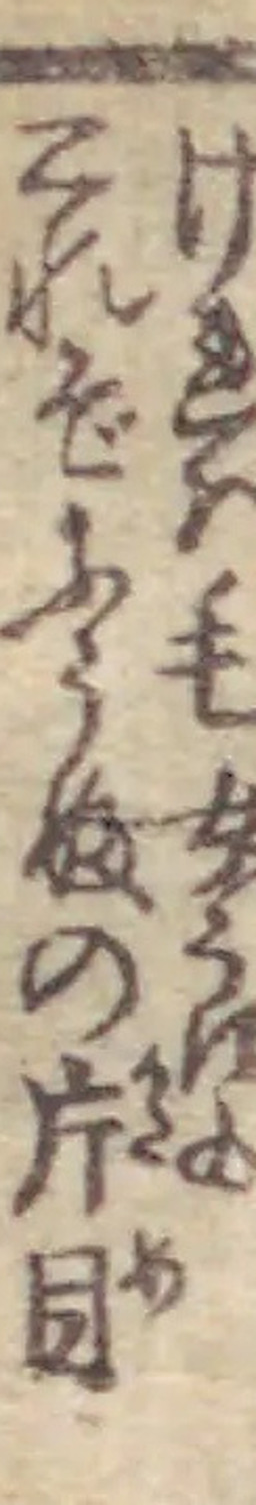これぞふうふの片目
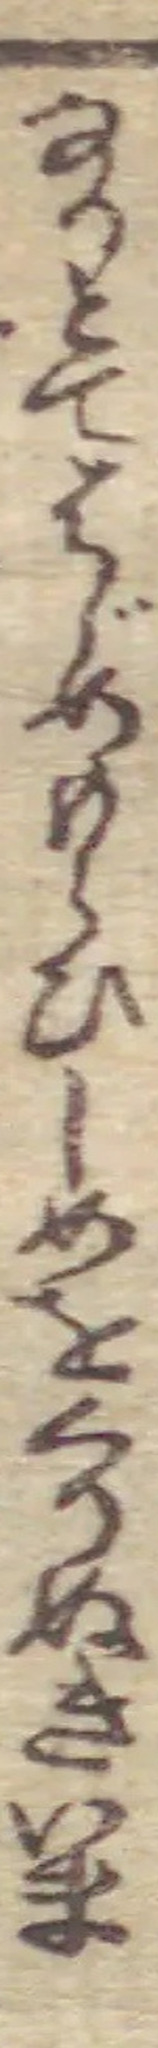なりとてはじめもらひしめをくりぬきいま
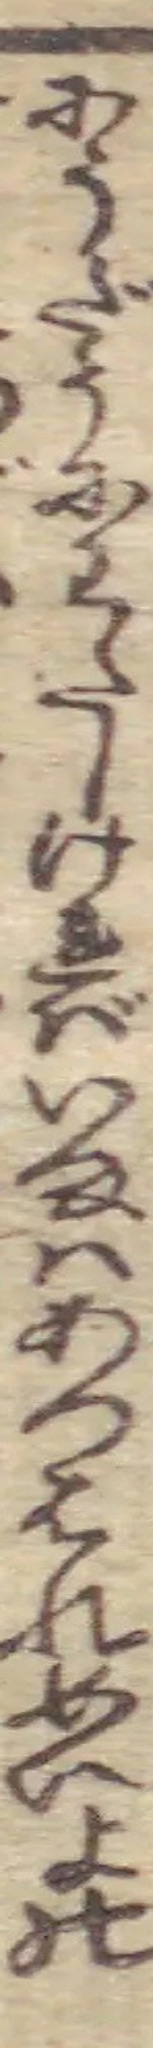にうだうにわたしければいまはあつはれめいよの
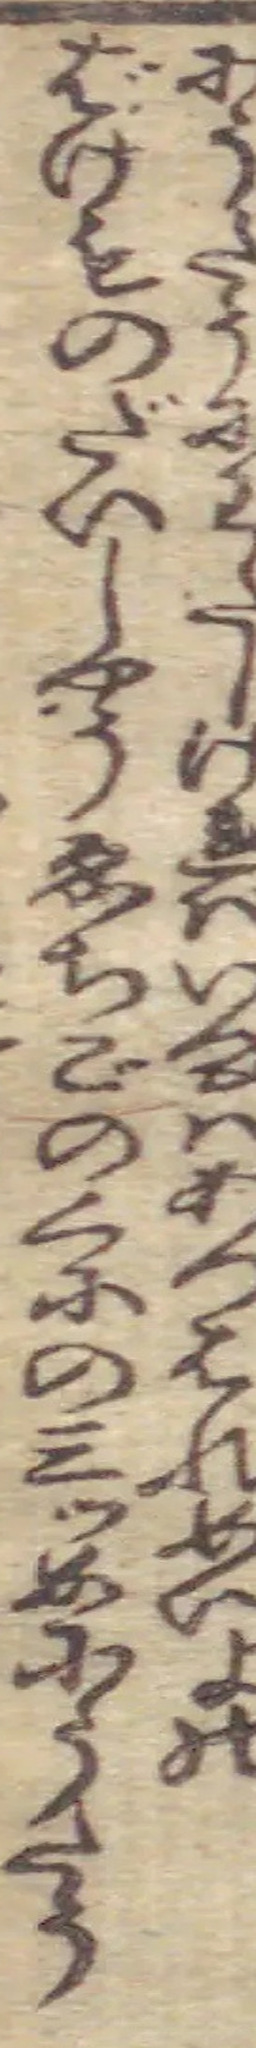ばけものだいしやうゑちごのくにの三つめにうたう
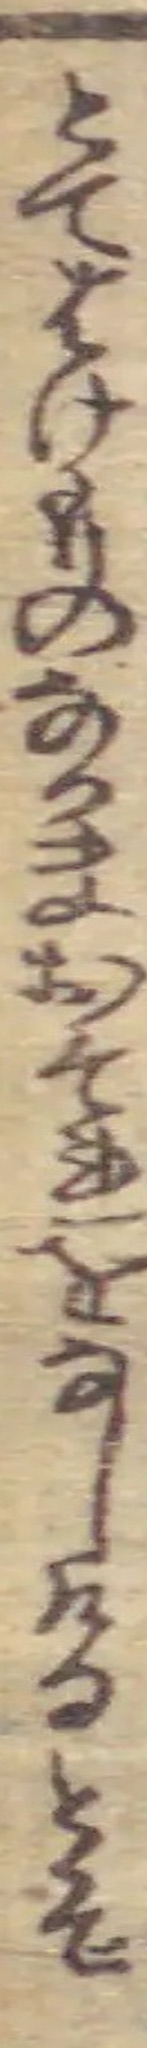とてはけものなかまおそれをなしけるとぞ

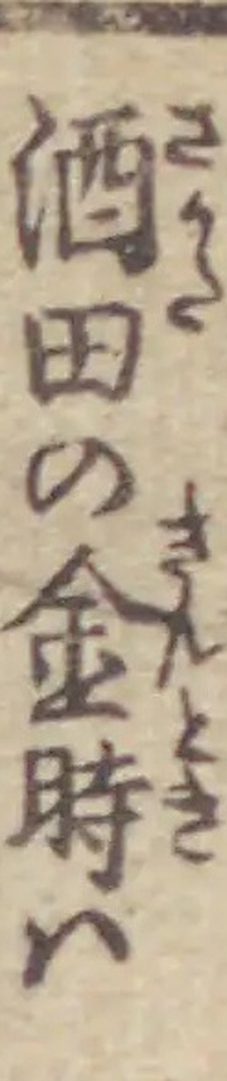酒田の金時は
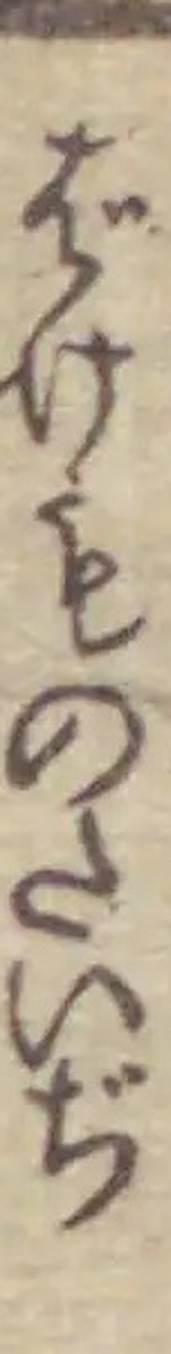ばけものたいぢ
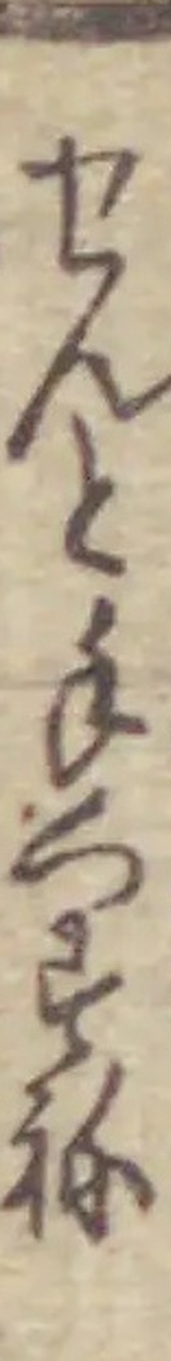せんとてくすね
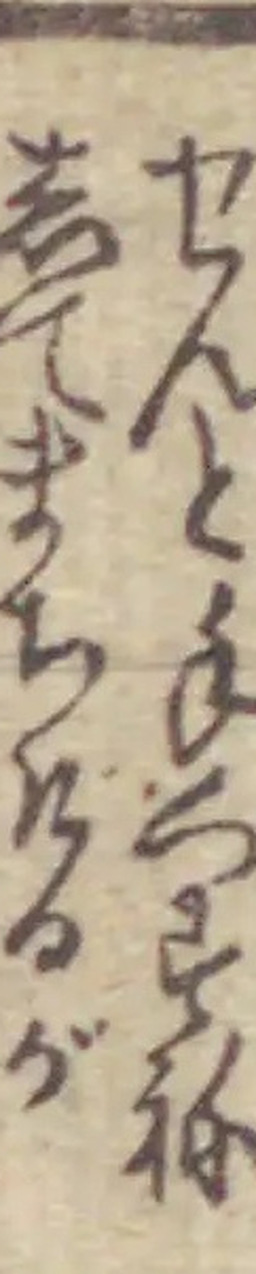してまちけるが
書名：大昔化物双紙 2巻
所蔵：国立国会図書館 National Diet Library, JAPAN
